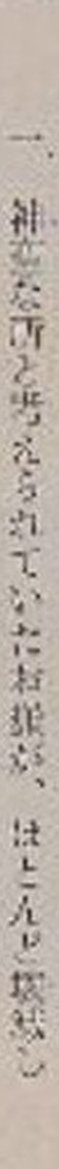一、神聖な所と考えられていたお嶽が、ほとんど壊滅し
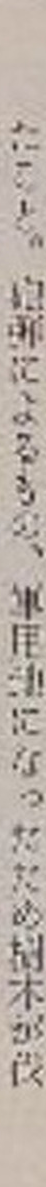たこと。砲弾によるもの、軍用地になったため樹木が伐
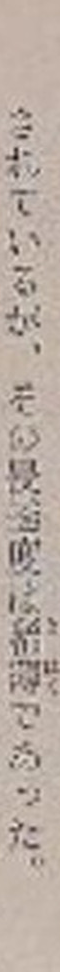されているが、その侵透度は稀薄であった。
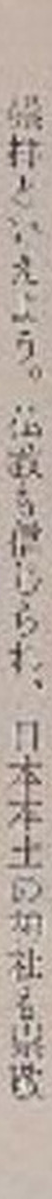崇拝といえよう。仏教も信じられ、日本本土の神社も崇敬
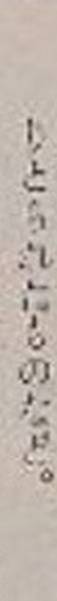りとられたものなど。
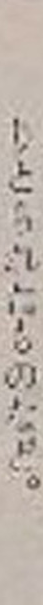りとられたものなど。
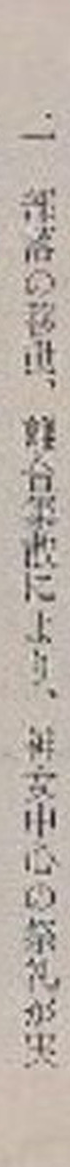二、部落の移動、離合集散により、神女中心の祭礼が実
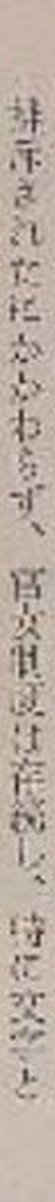排斥されたにかかわらず、官女制度は存続し、特に文字と
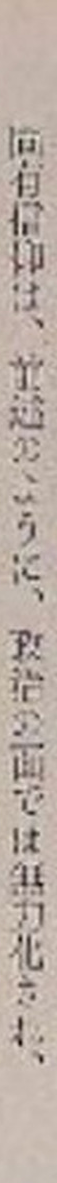固有信仰は、前述のように、政治の面では無力化され、
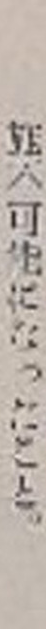施不可能になったこと。
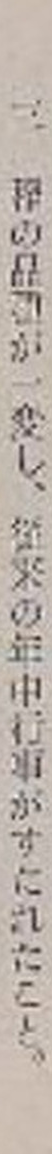三、稲の品種が一変し、従来の年中行事がすたれたこと。
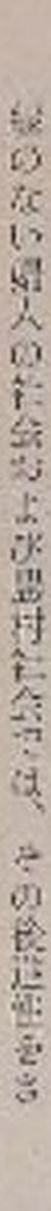縁のない婦人の社会および農村社会では、その後進性をさ
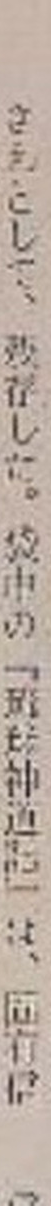さえとして、残存した。袋中の『琉球神道記』は、固有信
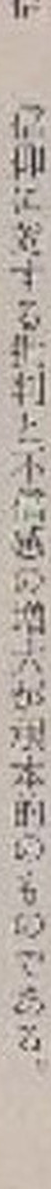信仰に対する批判と不信感の増大が根本的のものである。
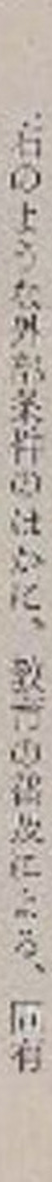右のような外部条件のほかに、教育の普及による、固有
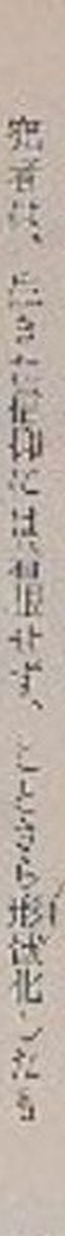究者は、生きた信仰には着眼せず、ことさら形骸化したも
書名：沖縄固有信仰のおとろえ
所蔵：University of the Ryukyus Library
